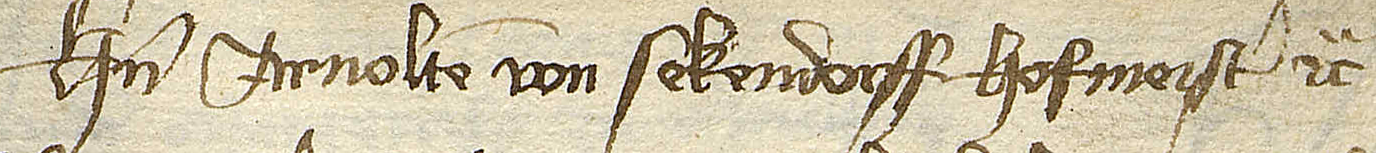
Hn* Arnolte* von ſekendorff hofmeiſt* ec*
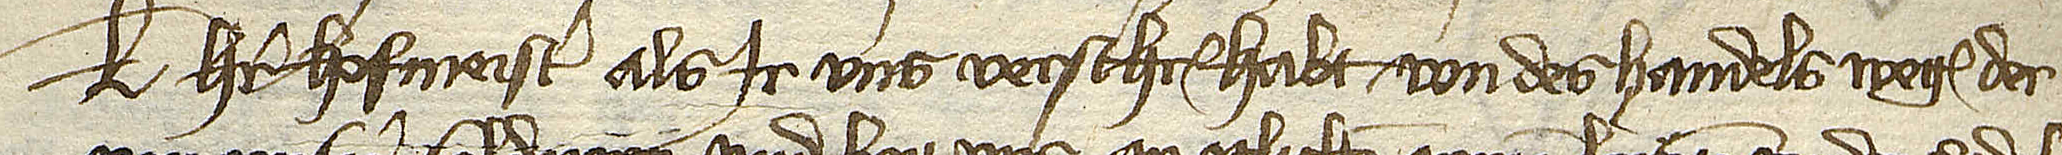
L* hr* hofmeiſt* als Ir vns verſchr* habt / von des handels weg* der
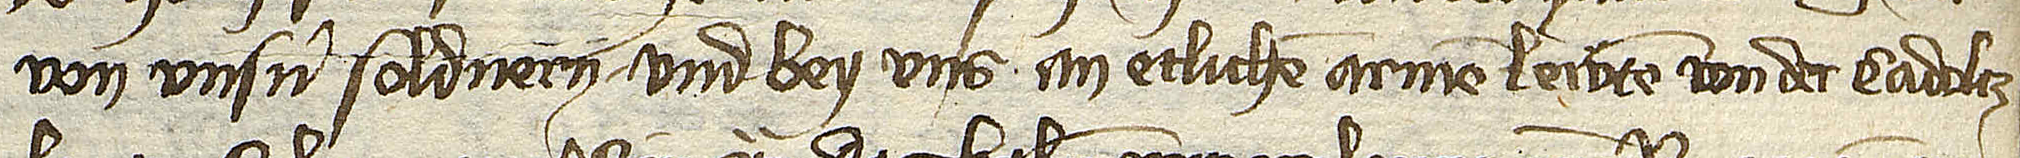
von vnſn* ſoldnern / vnd bey vns an etliche* arme* lewte* von der Cadolcʒ
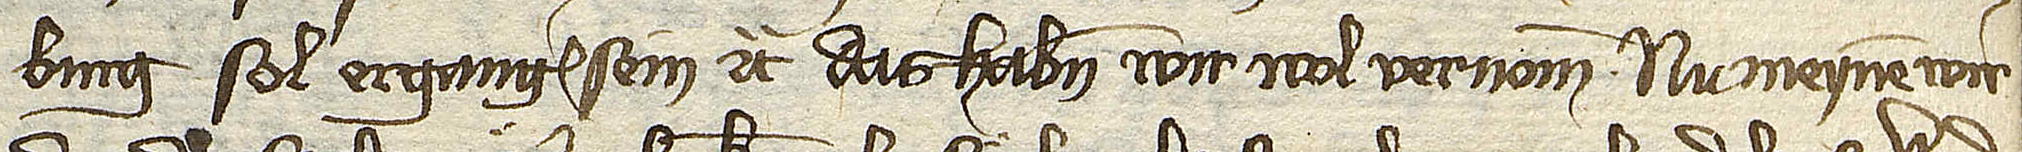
burg ſol ergang* ſein ec* das habn* wir wol vernom* . Nu meyne* wir
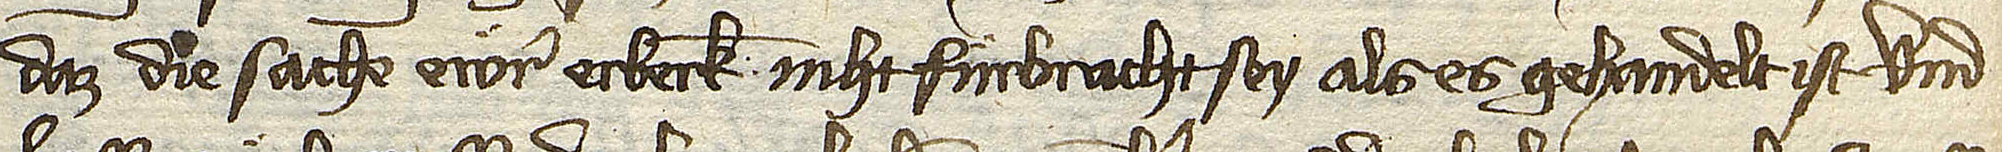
daʒ die ſache eẅr* erberk* niht fürbracht ſey als es gehandelt iſt Vnd
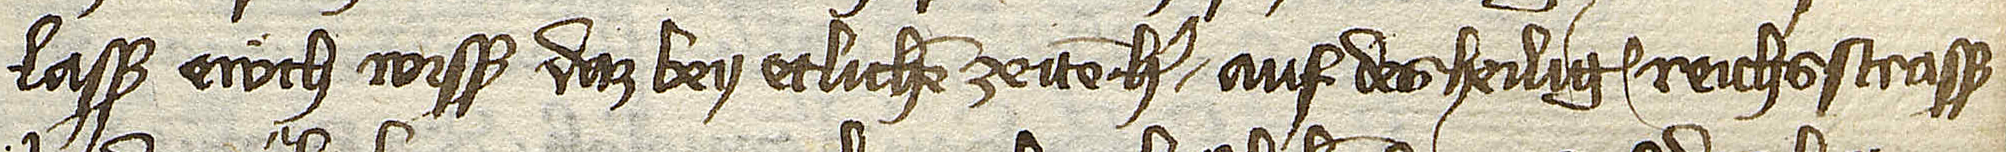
laſſ* eẅch wiſſ* daʒ bey etliche* ʒeite* h* / auf des heilig* reichs ſtraſſ*
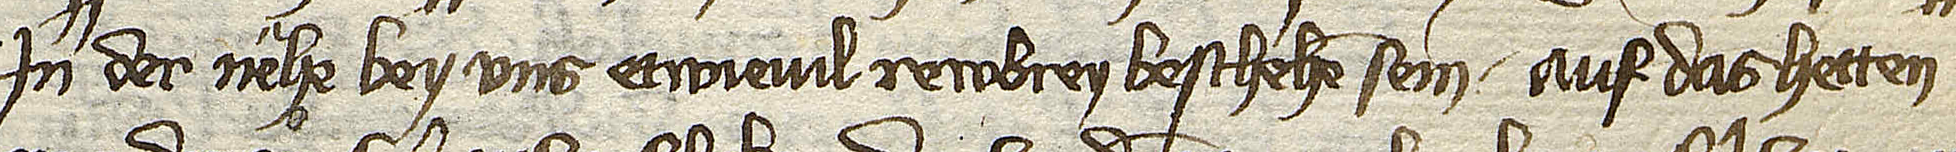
In der nëhe bey vns etwieuil rewbrey beſchehe* ſein / auf das hetten
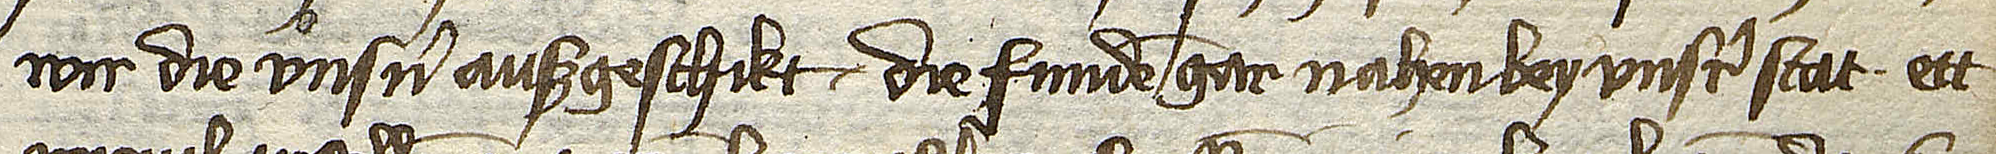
wir die vnſn* auſʒgeſchikt / Die funde* gar nahen bey vnſr* ſtat . ett
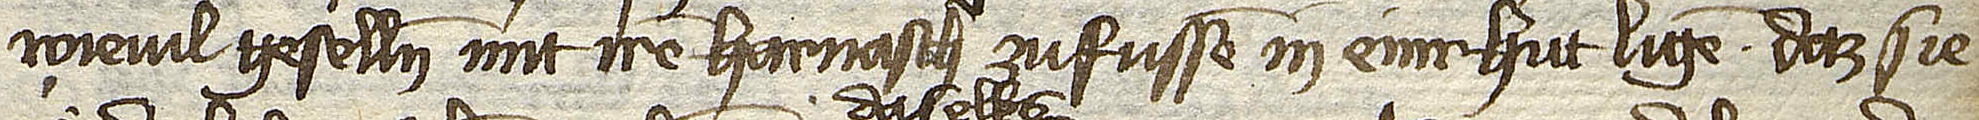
wieuil geſelln* mit ire* harnaſch ʒufuſſe* in einr hut lige* . daʒ ſie
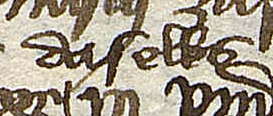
daſelbs
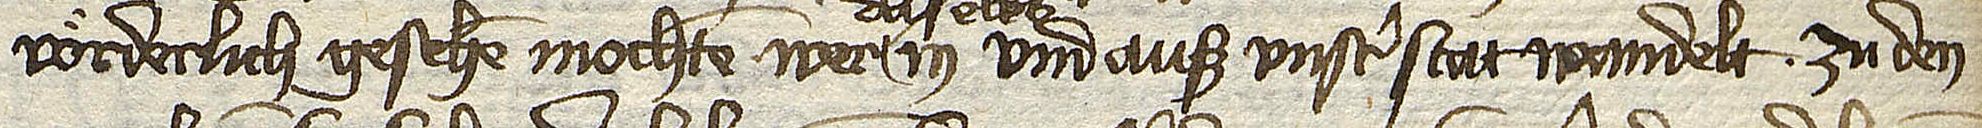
vörderlich geſehe* mochte* wer in vnd auſʒ vnſr* ſtat wandelt . ʒu den
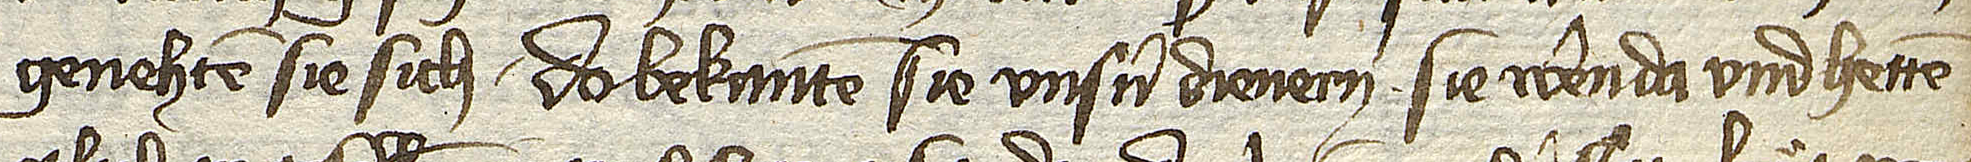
genehte* ſie ſich / Do bekante* ſie vnſn* dienern . ſie w*en da vnd hette*
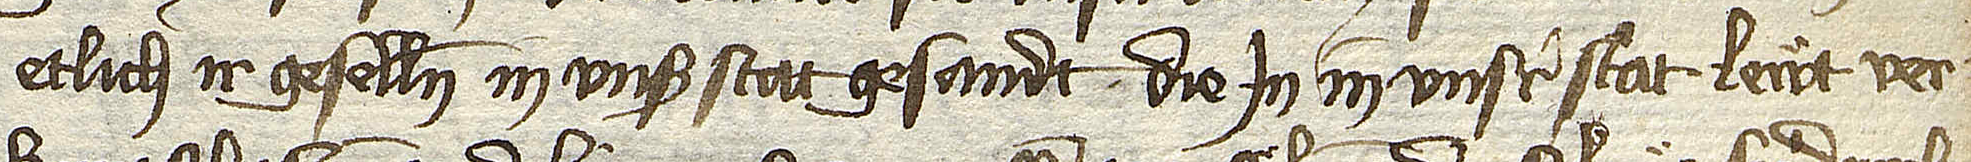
etlich ir geſelln* in vnſ* ſtat geſandt / die In in vnſr* ſtat . leẅt ver =
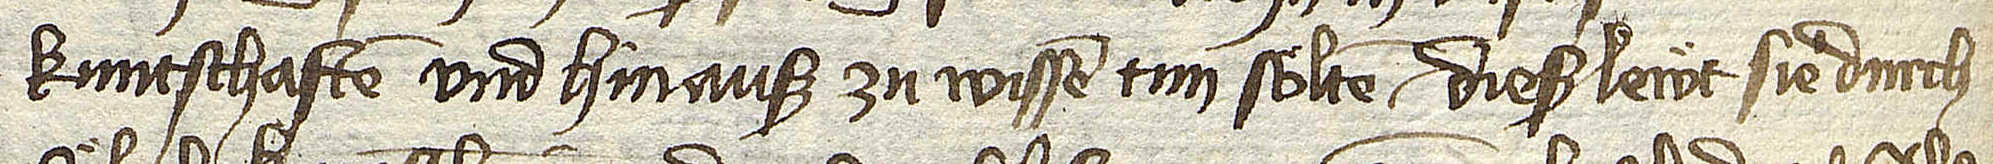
kuntſchafte* vnd hinauſʒ ʒu wiſſe* tun ſölte* / dieſ* leẅt ſie durch
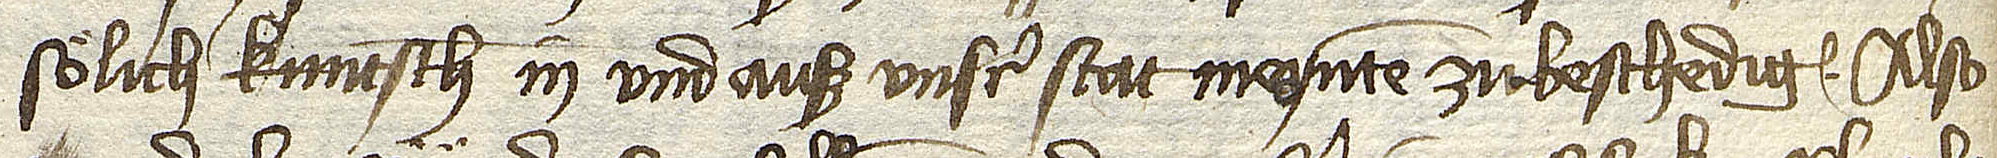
ſölich kuntſch* in vnd auſʒ vnſr* ſtat meynte* ʒu beſchedig* . Alſo
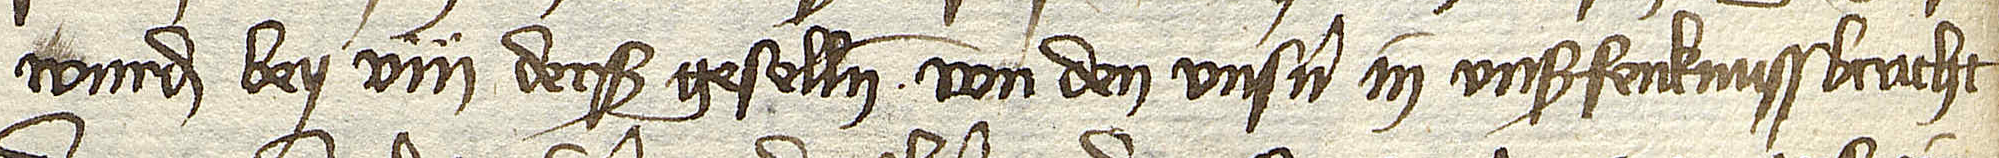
wurd* bey viii derſ* geſelln* . von den vnſn* in vnſ* fenknuſſ bracht
